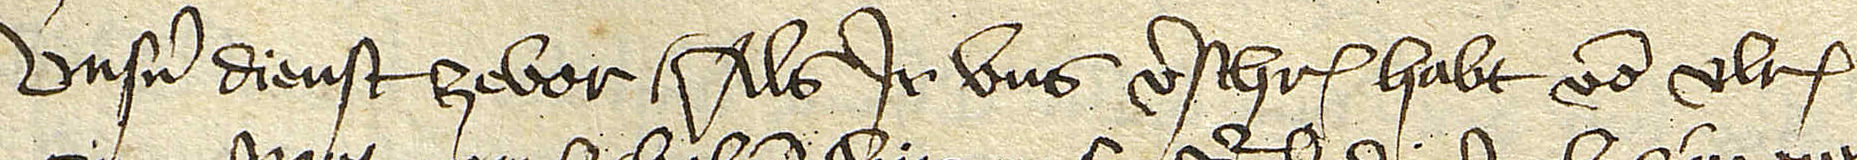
Vnſn* dienſt cʒevor / Als Ir vns v*ſchr* habt vo* vlr*
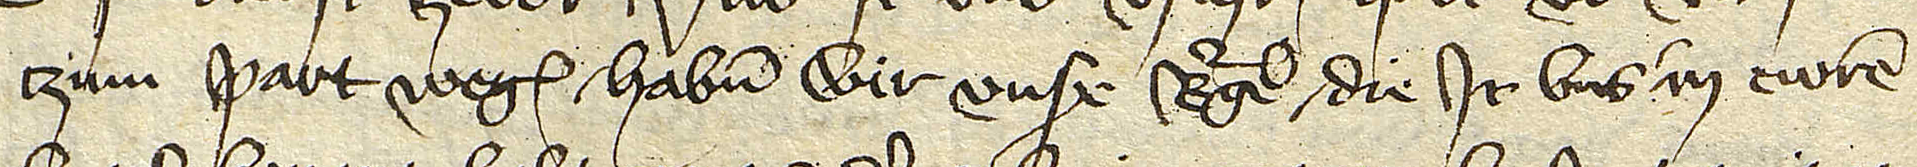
cʒum Part weg* / habn* wir vnſ*e B*ge* / die Ir vns in ewre*
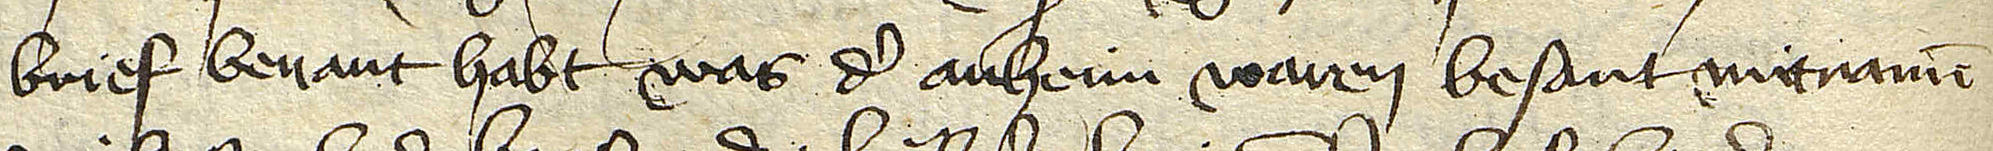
brief benant habt was d* anheim waren beſant mitname*
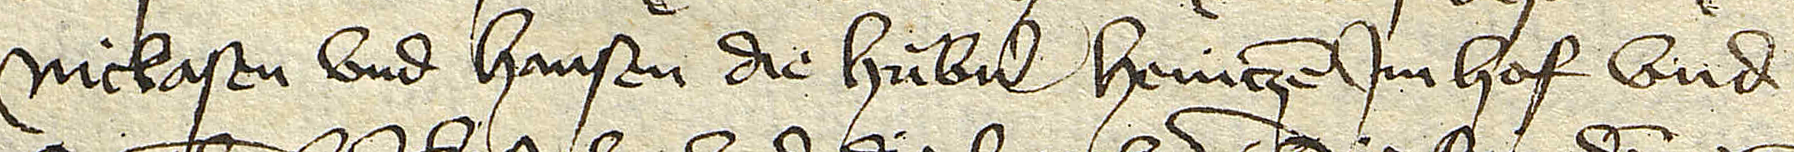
Niclaſen vnd hanſen die hübn* heincʒe* Imhof vnd
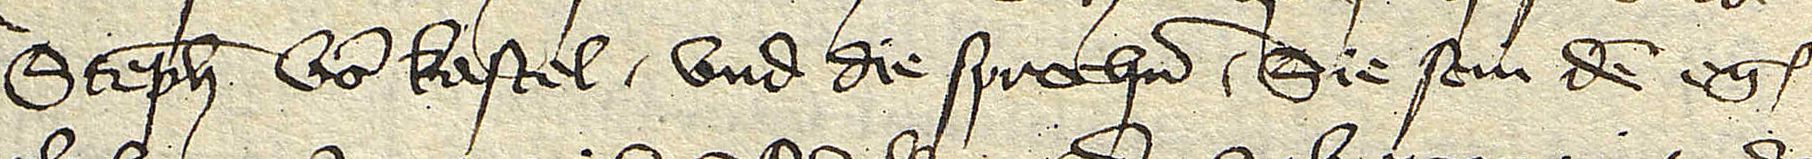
Steph* vo* kaſtel / vnd die ſprechn* / Sie ſein d* eg*
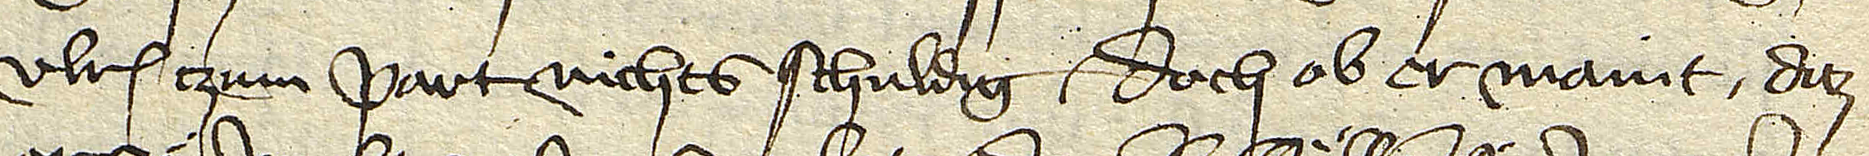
vlr* cʒum Part nichts ſchuldig / Doch ob er maint / daʒ
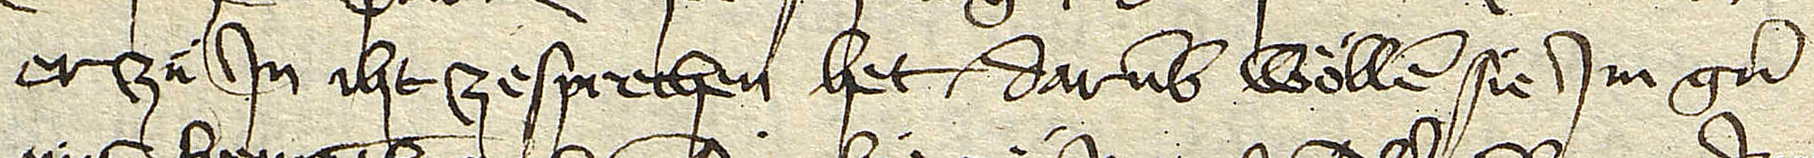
er cʒü In iht cʒeſprechen het / daru*b wölle* ſie Im gn*
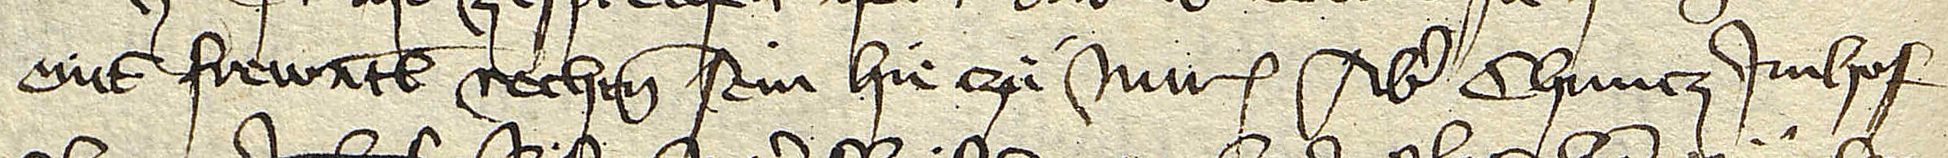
eins frewntl* rechtn* ſein hie cʒü Nur* Ab* Chuncʒ Imhof
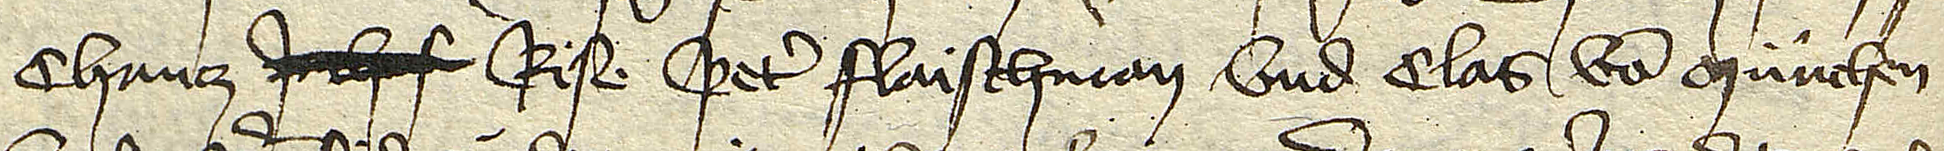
Chuncʒ Imhof Riſe Pet* Flaiſchman / vnd Clas vo* München
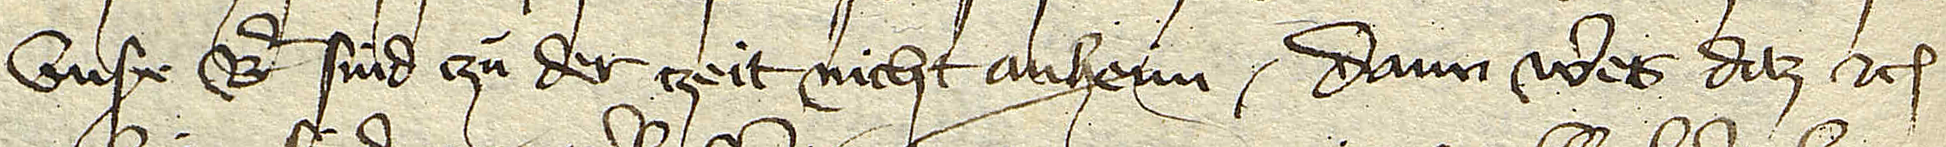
unſ*e B* ſind cʒü der cʒeit nicht anheim / Dann w*es daʒ ec*
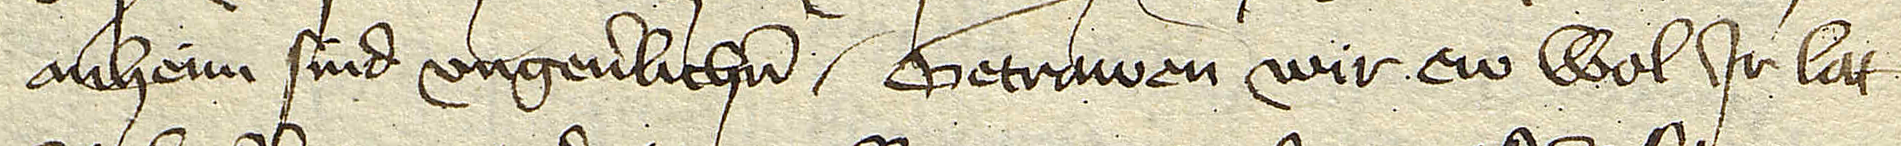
anheim ſind vngeu*lichn* / Getrawen wir ew wol Ir lat
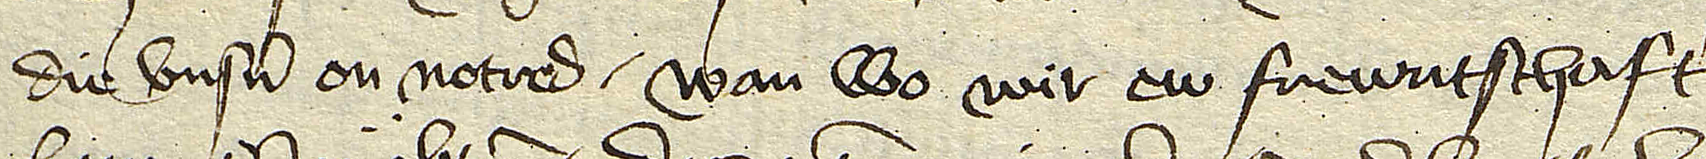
die vnſn* on notred / wan wo wir ew frewntſchaft
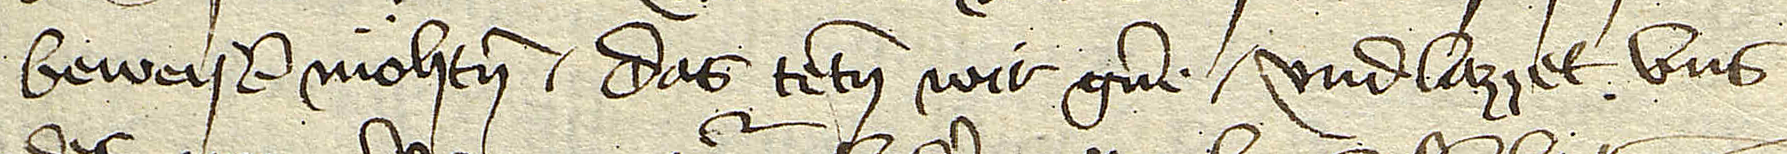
beweiſe* möhtn* / Das tetn* wir gn*e / vnd laʒʒet vns
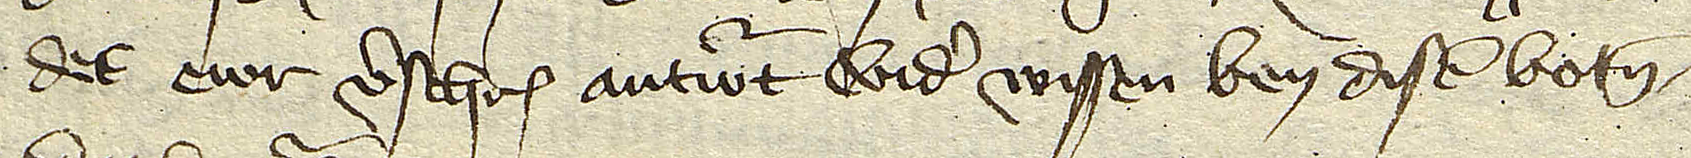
des ewr v*ſchr* antwt* wid* wiſſen bey diſe* botn* /
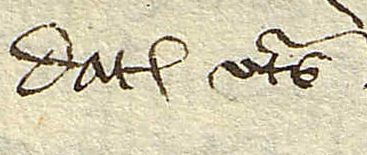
dat* vts*
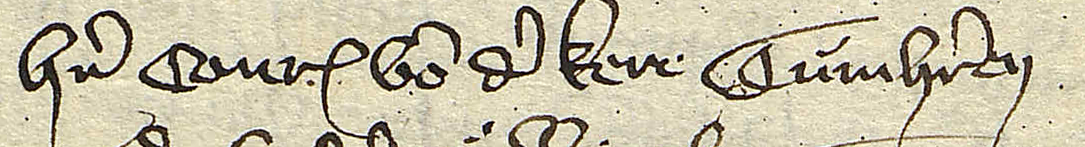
hn* Conr* vo* d* kere Tümhr*en
